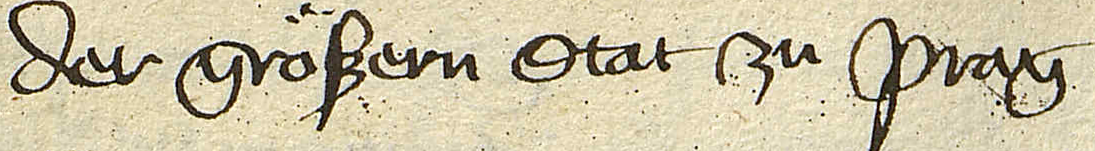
Der gröſʒern Stat cʒu Prag
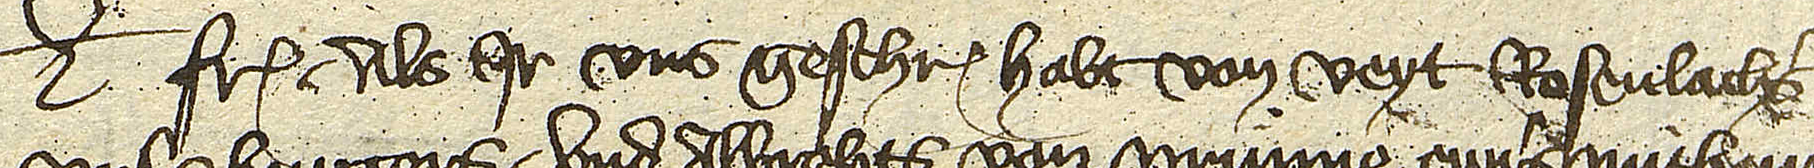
L* fr* / Als Ir vns geſchr* habt von veyt Roſenlachs*
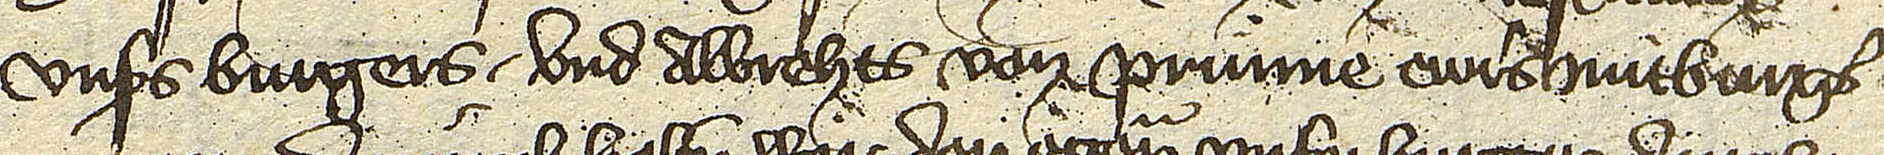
vnſ*s burgers / vnd Albrehts von Prünne ewrs* mitburgs*
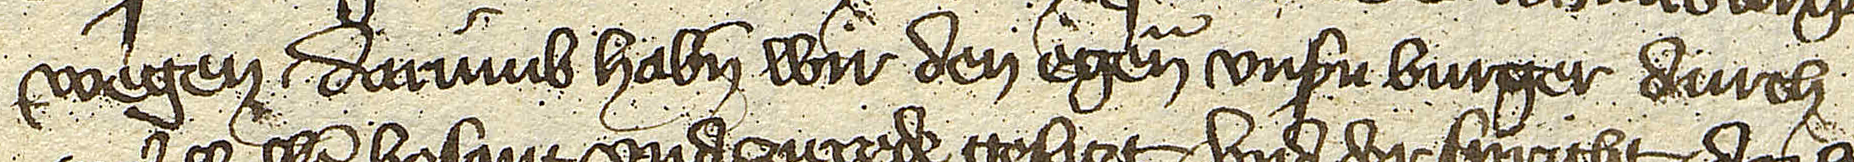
wegen / Darümb habn* wir den egen* vnſ*n burger durch
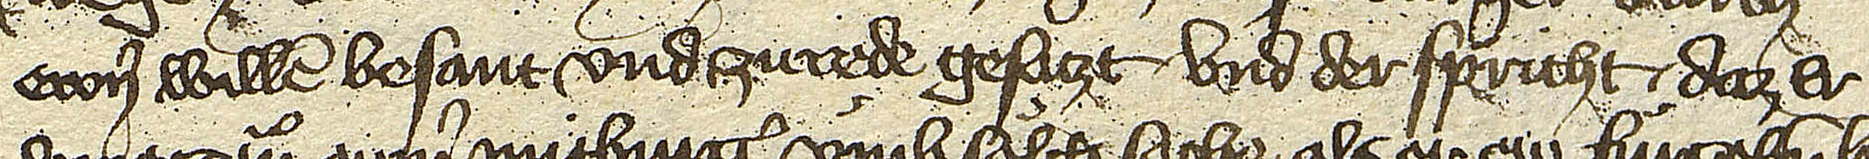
ewn* wille* beſant vnd cʒurede geſacʒt / vnd der ſpricht / daʒ Er
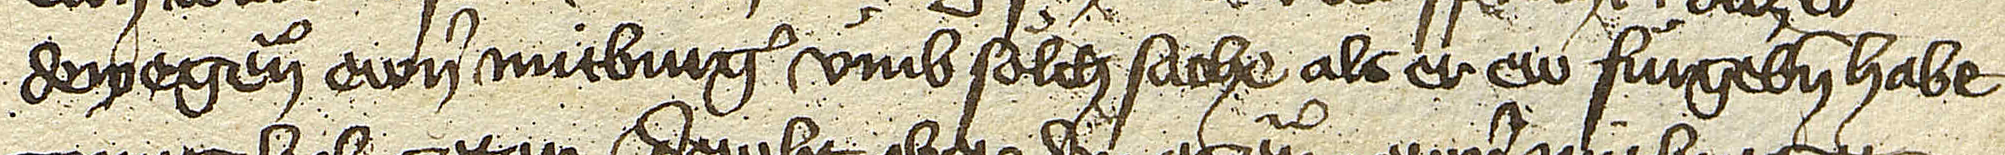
den egen* ewn* mitburg* v̈mb ſölch ſache als er ew fürgebn* habe
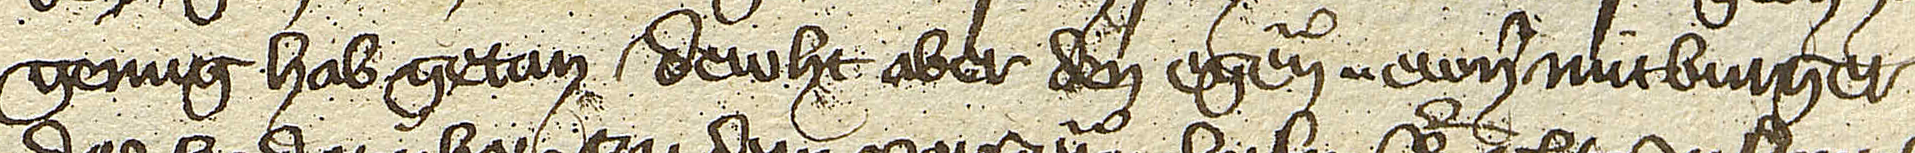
genug hab getan / dewht aber den egen* ~ ewn* mitburger
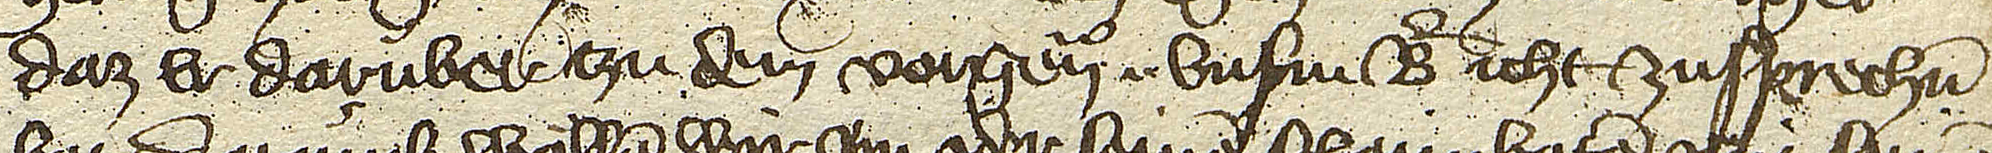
daʒ Er darüber cʒu dem vorgen* ~ vnſ*m B* icht cʒuſprechn*
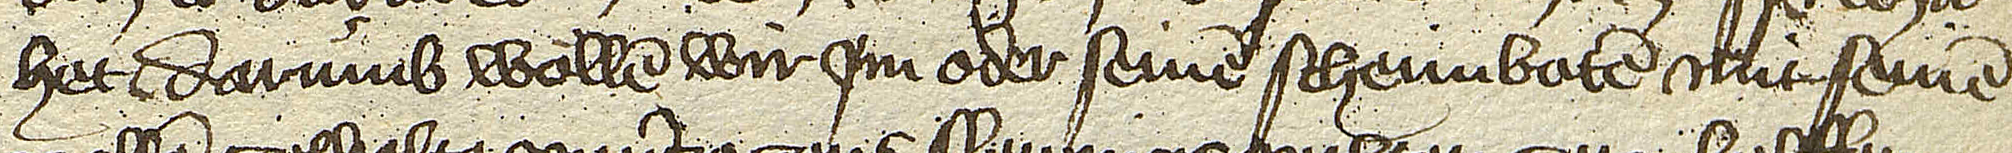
het / darümb wölle* wir Im oder ſeine* ſcheimbote* mit ſeine*
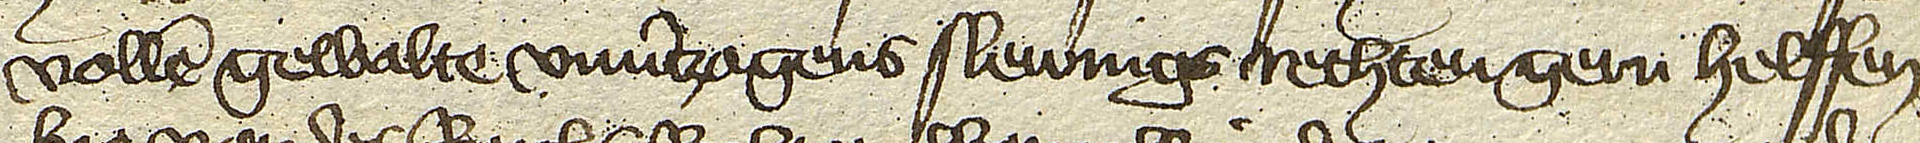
volle* gewalte vnu*cʒogens ſlewnigs* rechten gern helffen
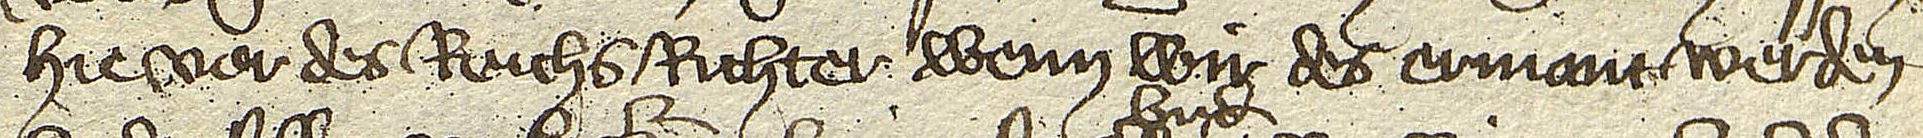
hie vor des Reichs Richter wenn wir des ermant werden
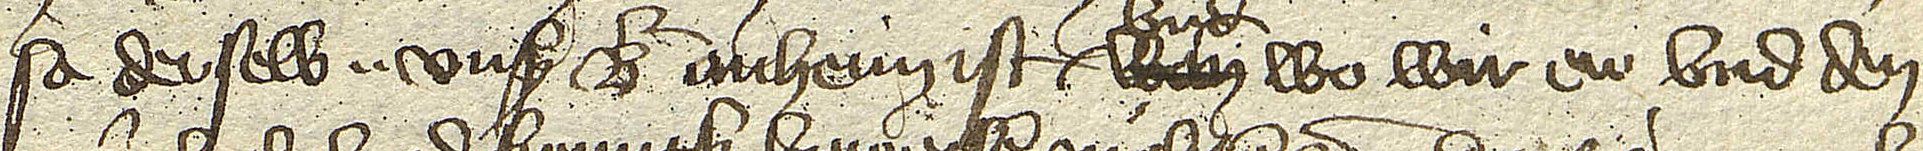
ſo derſelb ~ vnſ* B* anheim iſt / wan wo wir ew vnd den
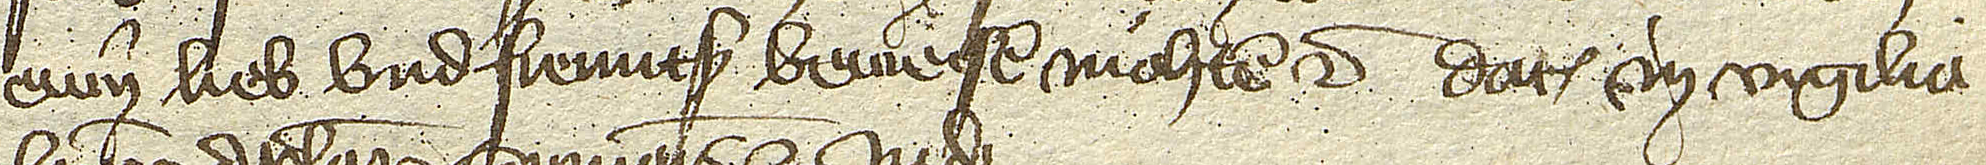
ewn* lieb vnd freuntſ* beweiſe* möhte* ec* dat* in vigilia
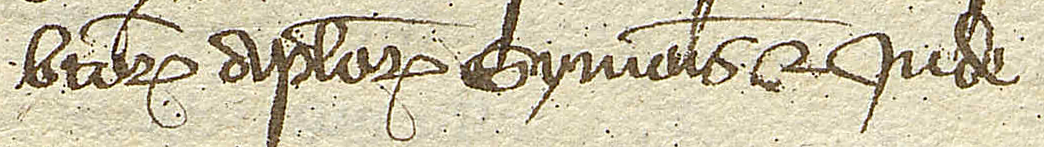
bto* Aplo* Symois* @ Iude
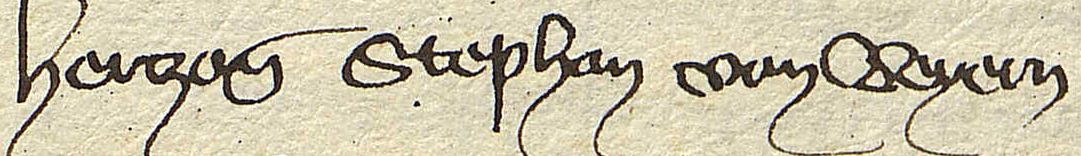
Hercʒog Stephan von Beyern
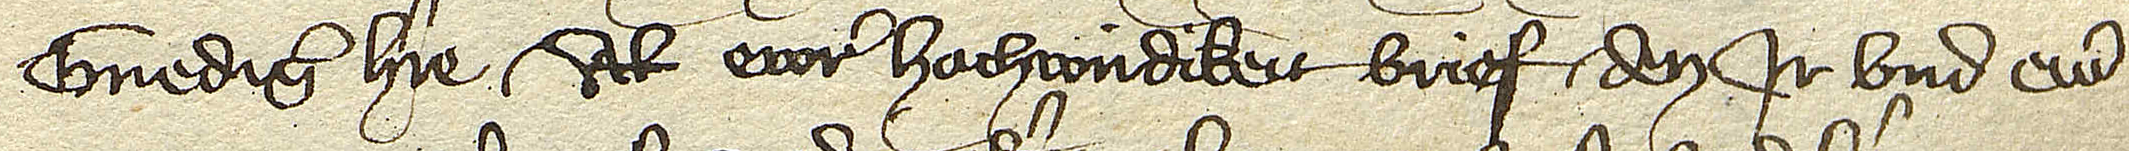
Gnedig* h*re / Al ewr* hochwirdikeit brief / den Ir vnd ew*
